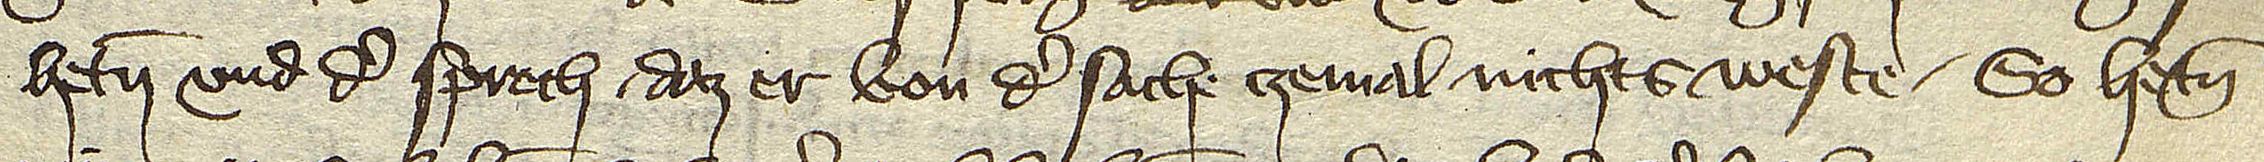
hetn* vnd d* ſprech / daʒ er von d* ſache cʒemal nichts weſte / So hetn*
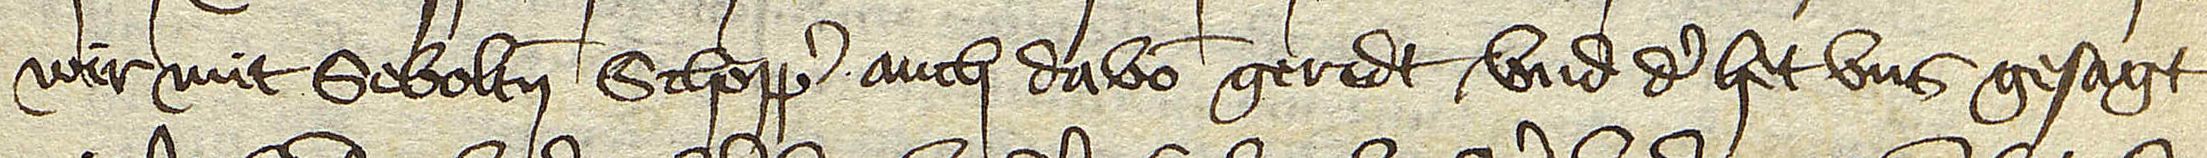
wir mit Seboltn* Schopp* auch davo* geredt / vnd d* het vns geſagt
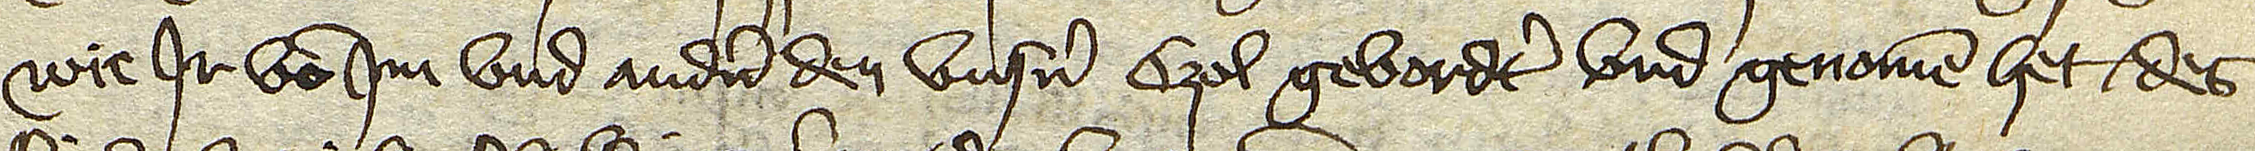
wie Ir vo* Im vnd andn* den vnſn* Cʒol gevordt* vnd genome* het / des
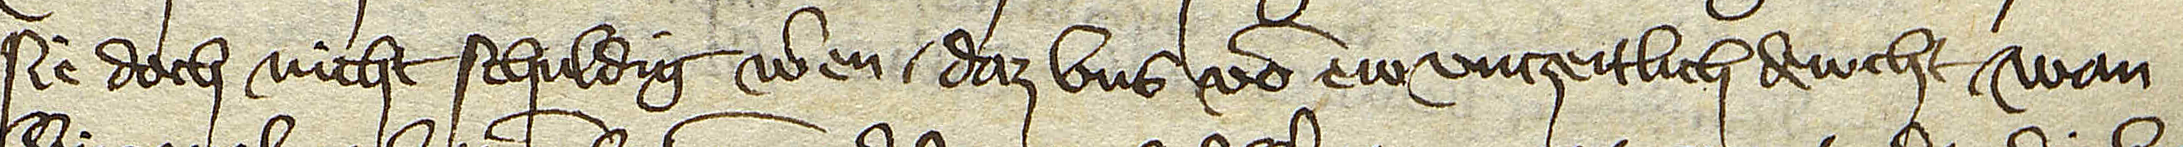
ſie doch nicht ſchuldig w*en / daʒ vns vo* ew vncʒeitlich dewcht / wan
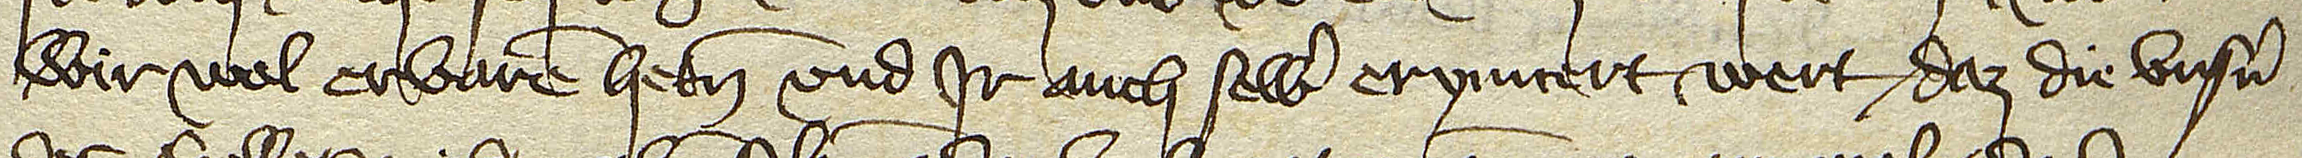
wir wol ervare* hetn* vnd Ir auch ſelb* erynnert wert / daʒ die vnſn*
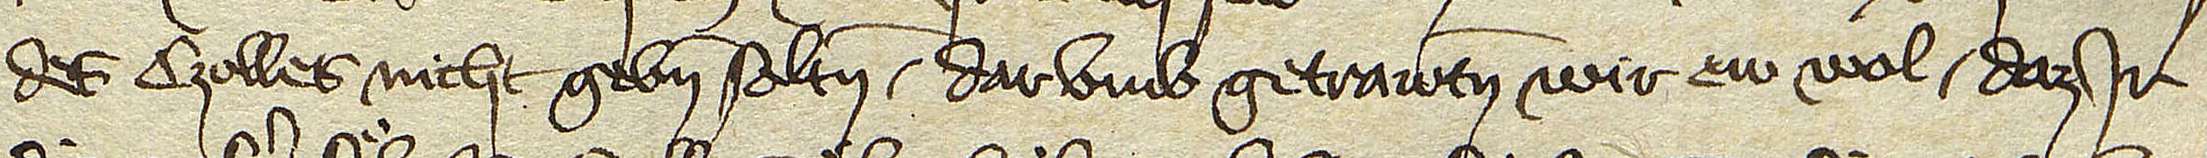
des Cʒolles nicht gebn* ſoltn* / darvmb getrawtn* wir ew wol / daʒ Ir
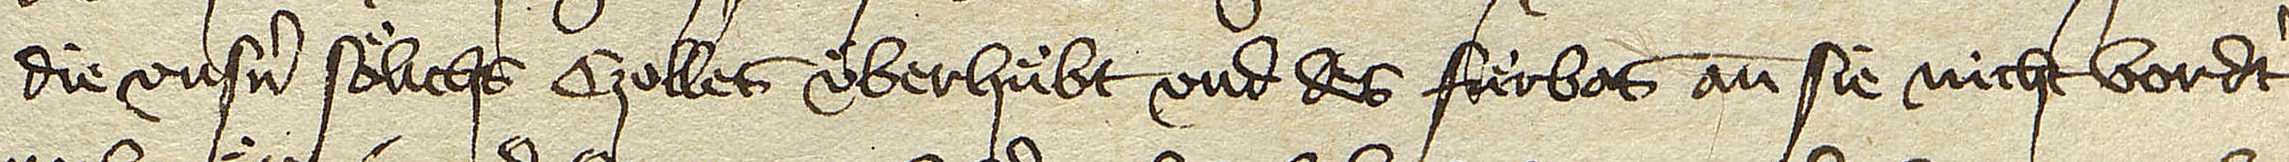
die vnſn* ſölichs Cʒolles v̈berhübt vnd des fürbas an ſie nicht vordt*
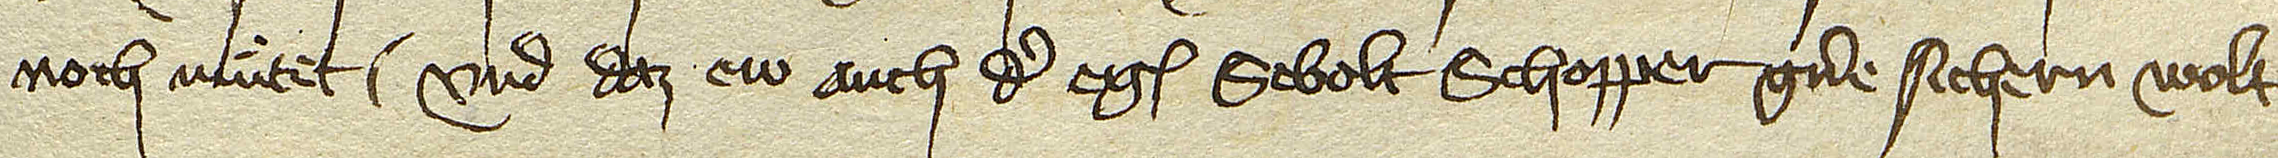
noch mütet / vnd daʒ ew auch d* eg* Sebolt Schopper g*ne ſichern wolt
